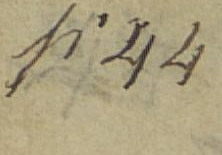p 44
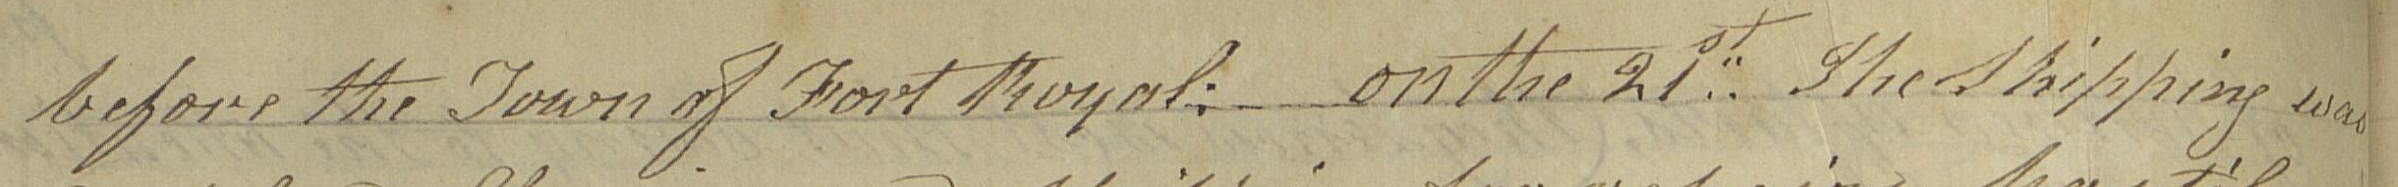before the Town of Fort Royal: on the 21^st. the shipping was
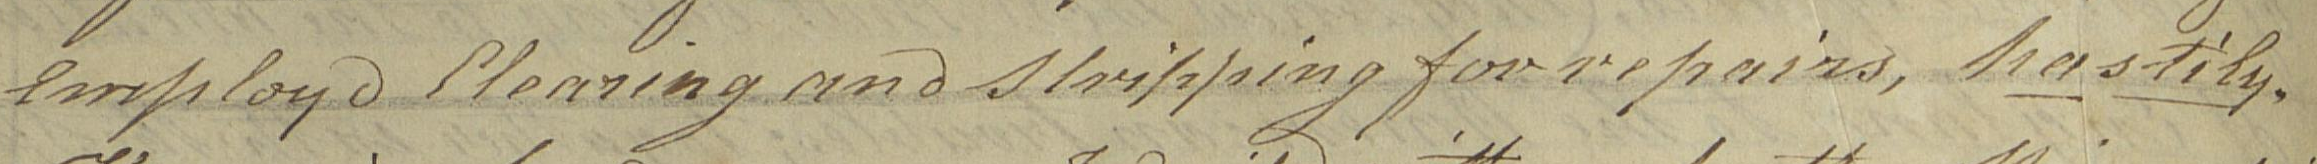Employd Clearing and stripping for repairs, hastily.
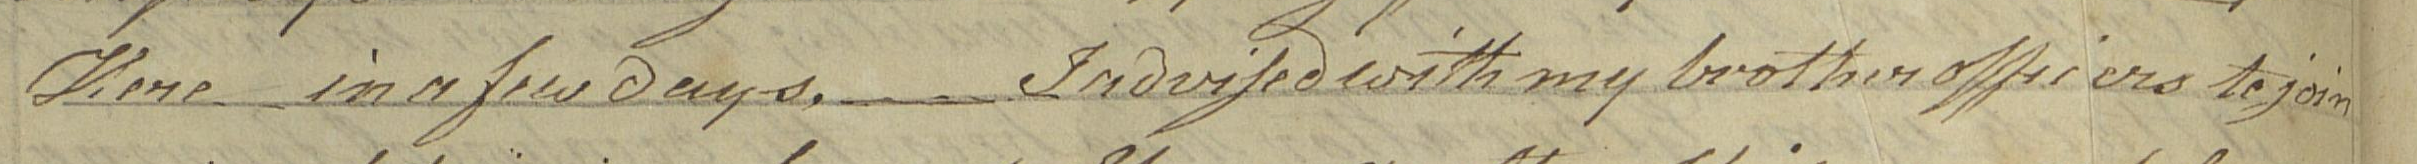There in a few days, I advised with my brother officers to join
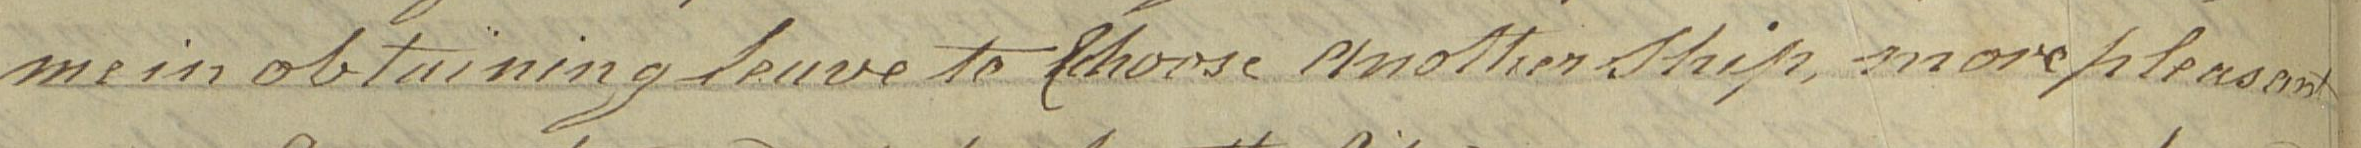me in obtaining leave to Choose mother Ship, more pleasant
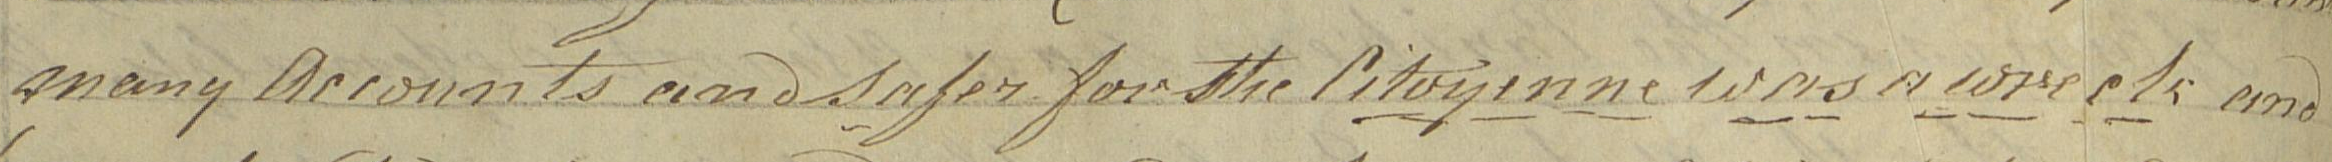many Accounts and safer for the Citoyenne was a wreck: and
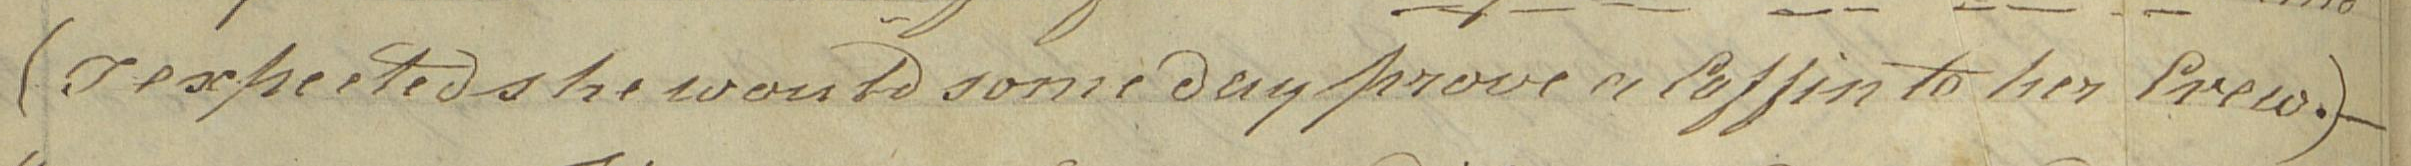(I expected she would someday prove a Coffin to her Crew.)
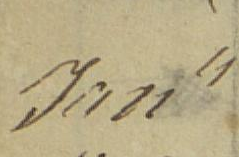Jan^y
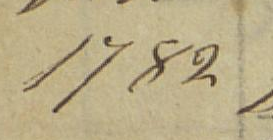1782
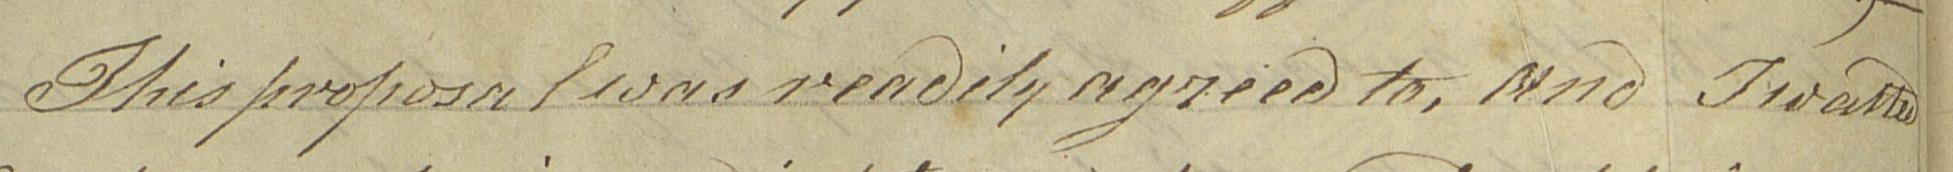This proposal was readily agreed to and I waited
